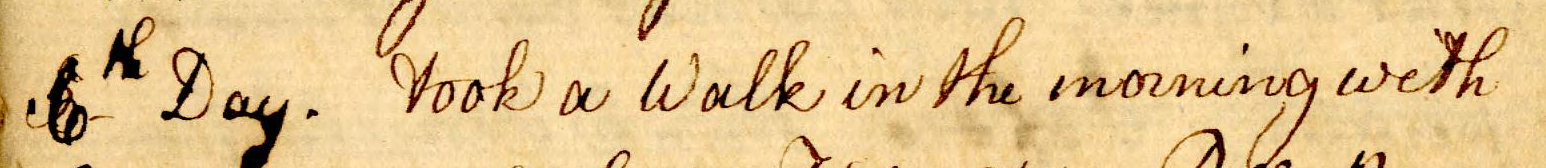6^th Day- took a Walk in the morning with
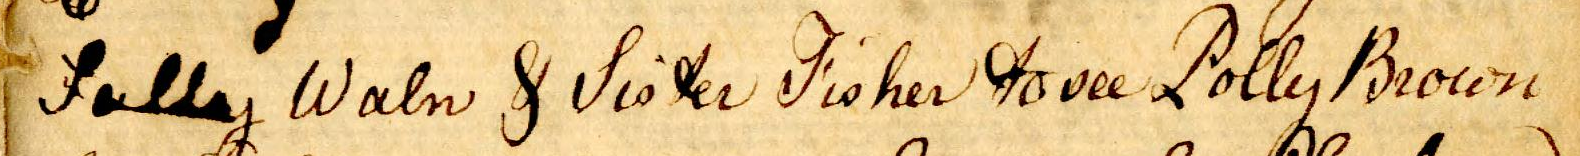Sally Waln & Sister Fisher to see Polly Brown
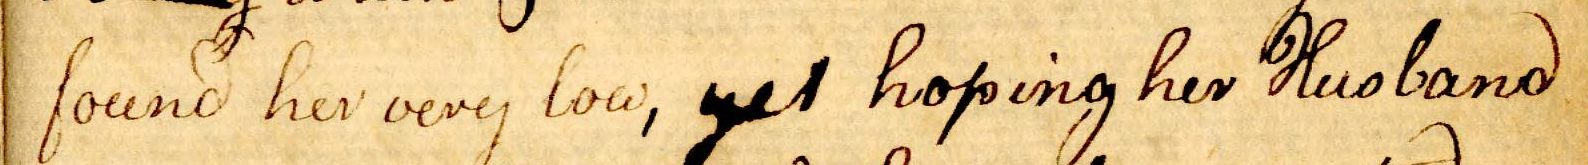found her very low, yet hoping her Husband
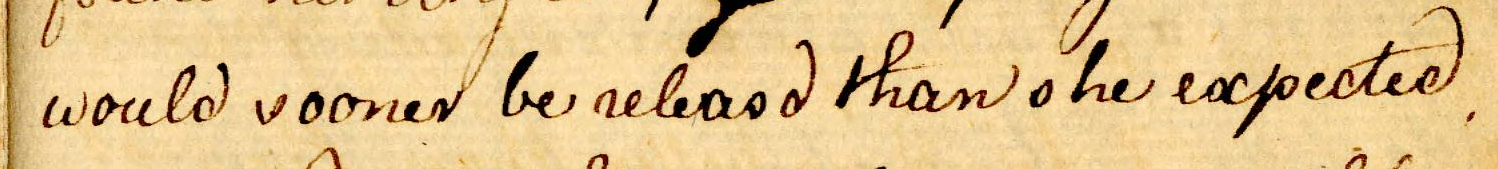would sooner be releasd than she expected
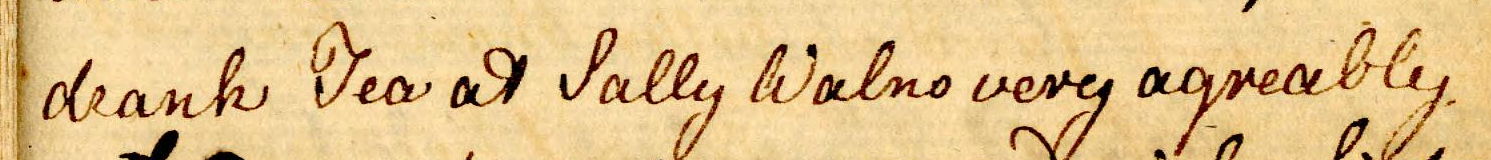drank Tea at Sally Walns very agreably
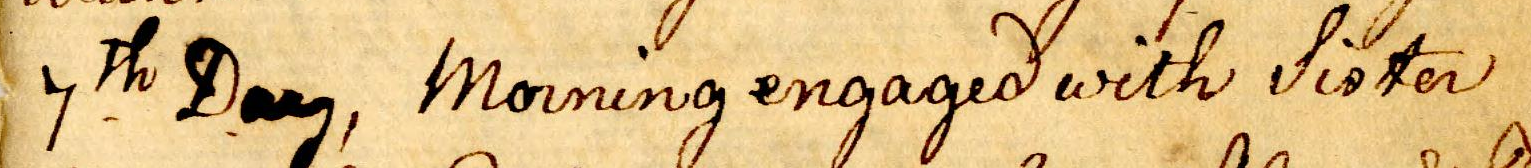7^th Day, Morning engaged with Sister
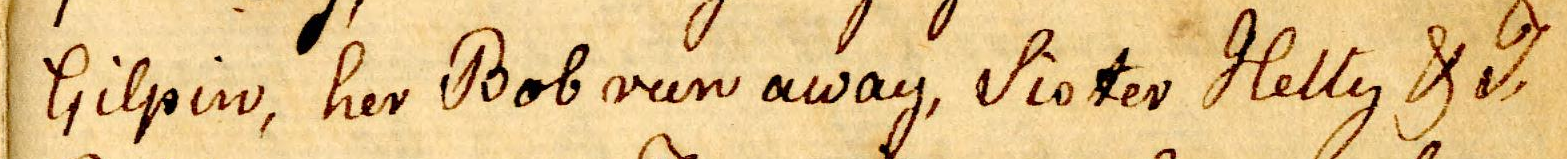Gilpin, her Bob run away, Sister Hetty & T,
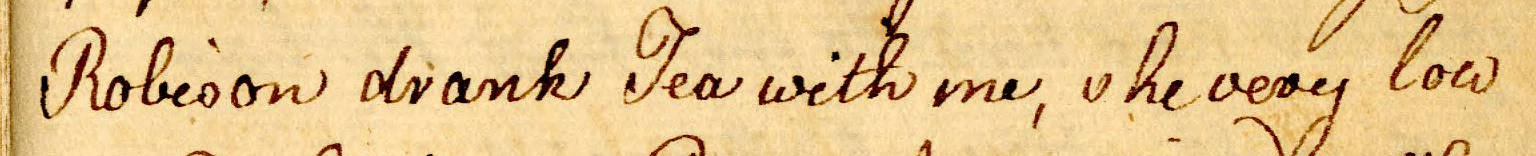Robison drank Tea with me, she very low
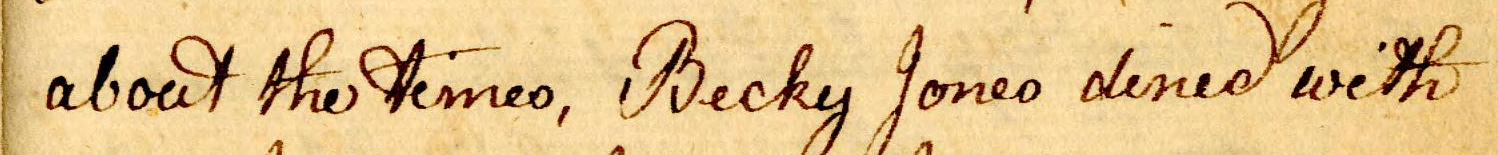about the times, Becky Jones dined with
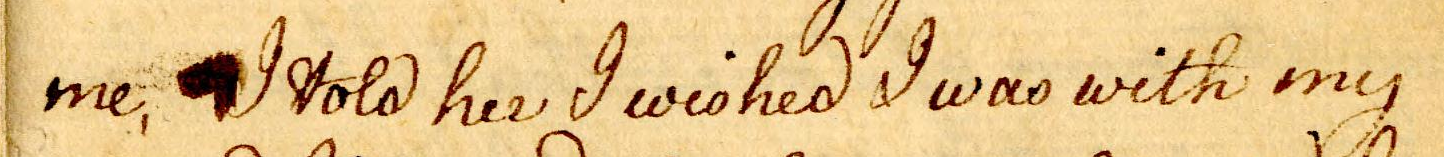me, I told her I wished I was with my
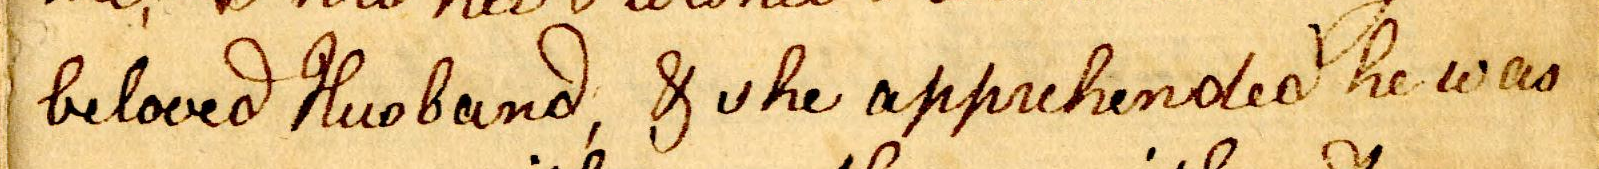beloved Husband, & she apprehended he was
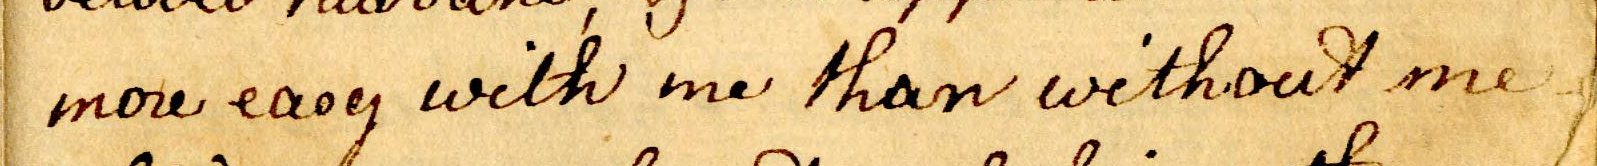more easy with me than without me
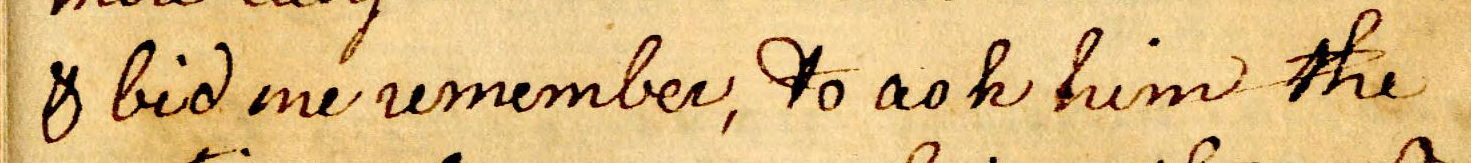& bid me remember, to ask him the
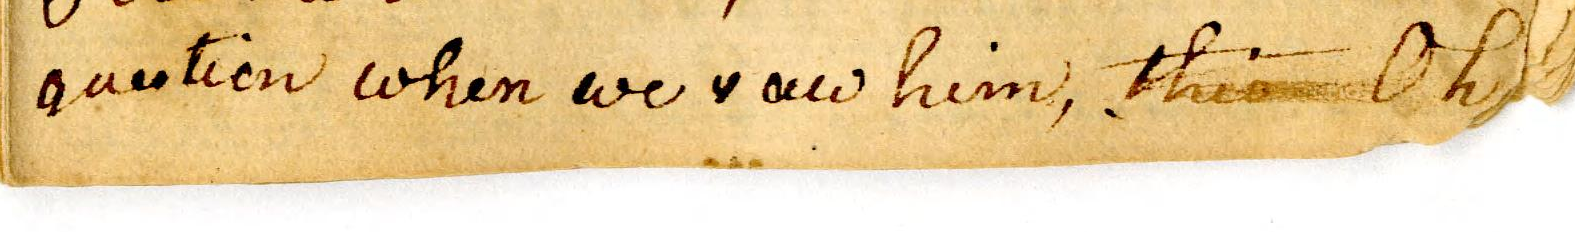question when we saw him, this Oh
